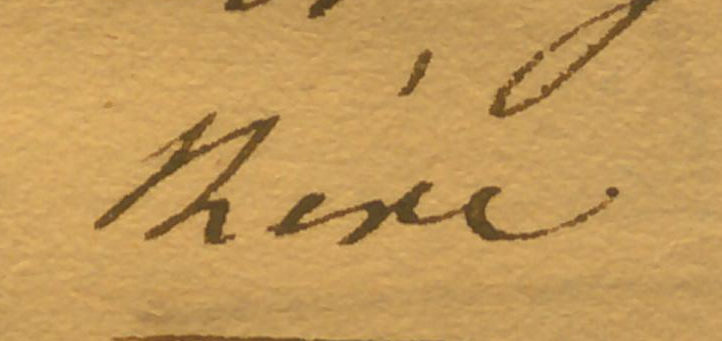there
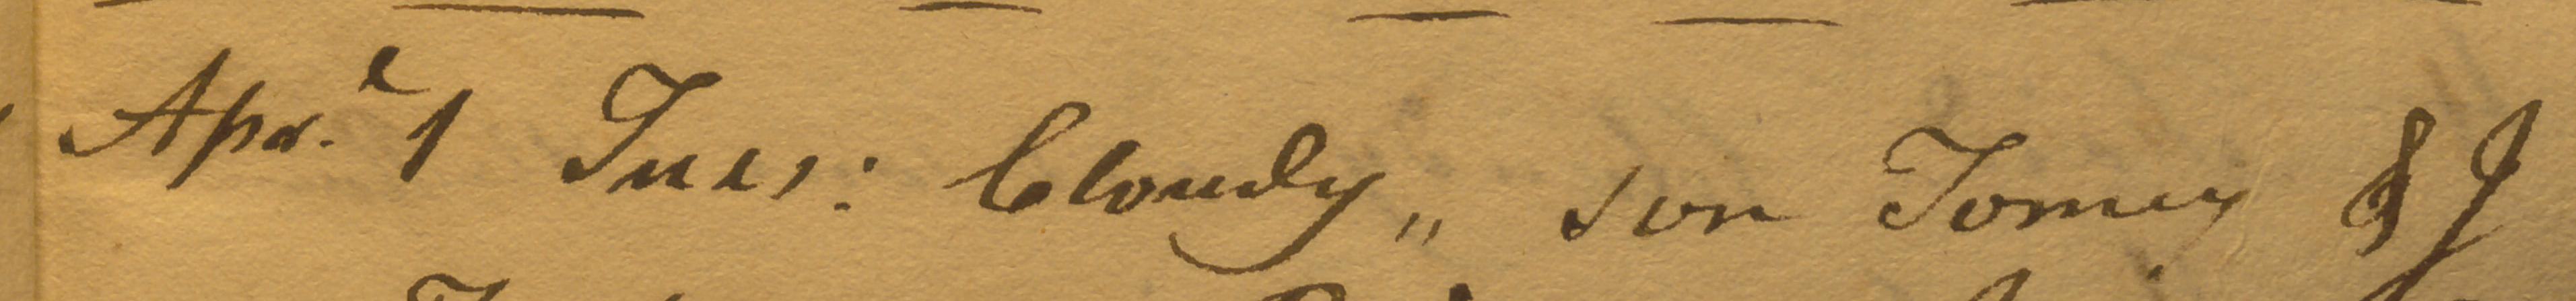Apr^l. 1 Tues: Cloudy. son Tomey & I
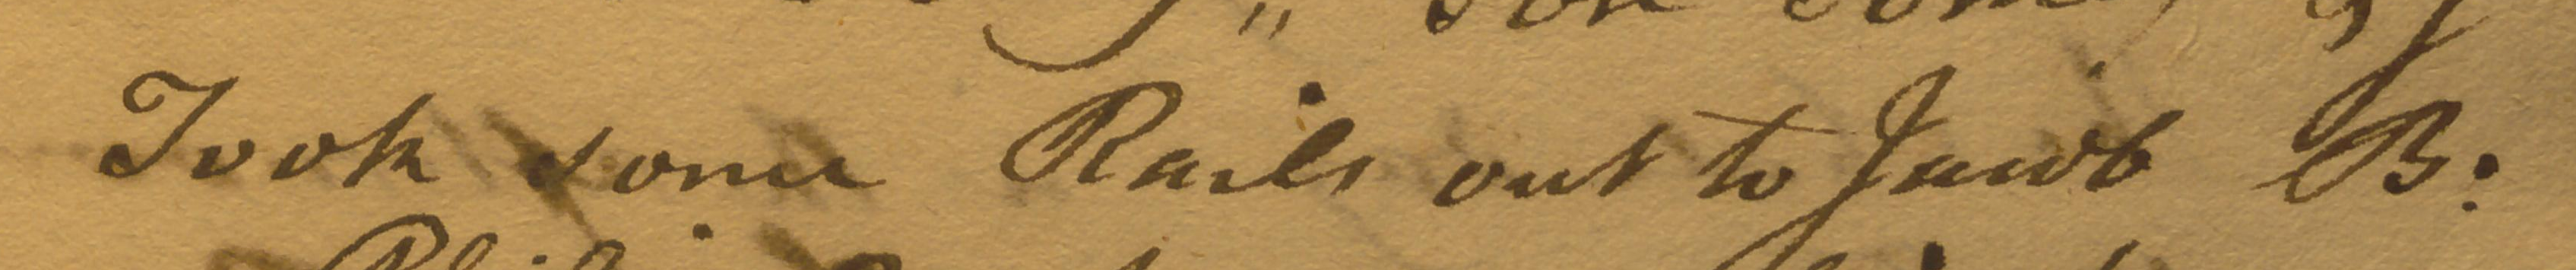Took some Rails out to Jacob B.
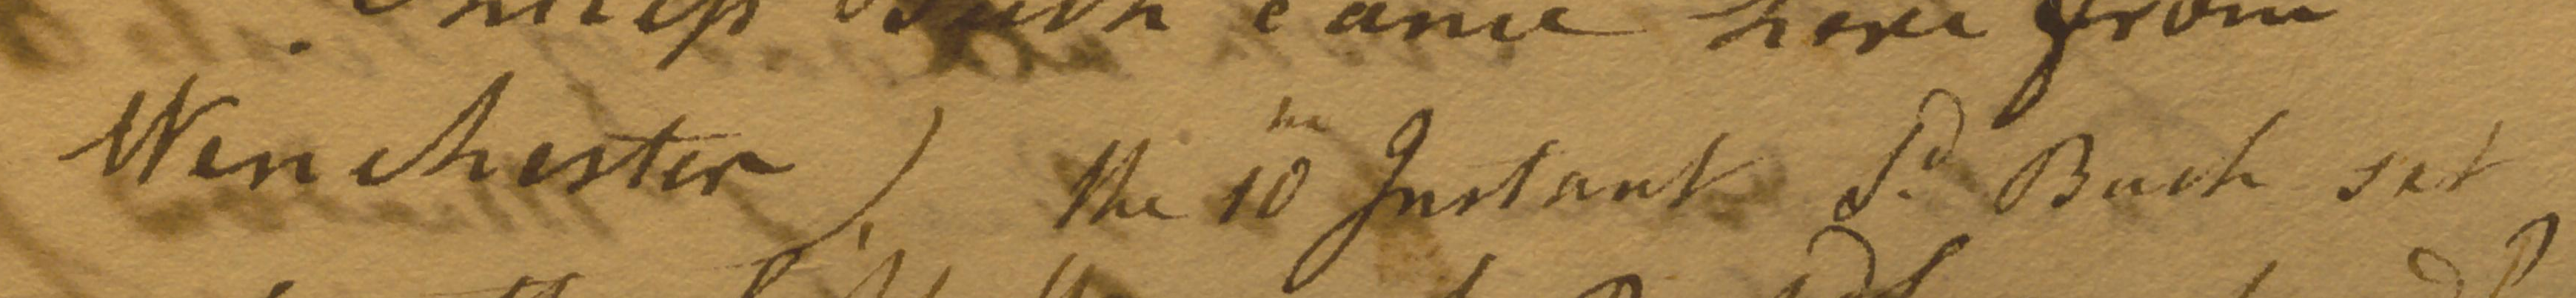Winchester) the 10^th Instant s^d. Bush set
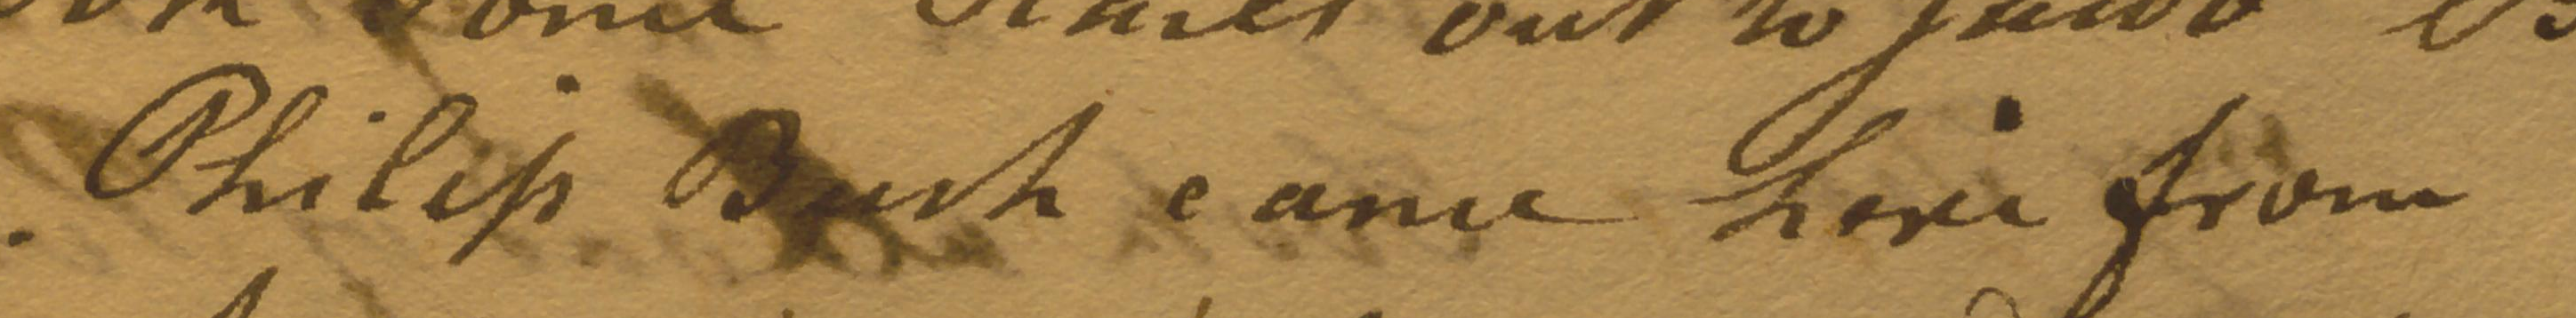Philip Bush came here from
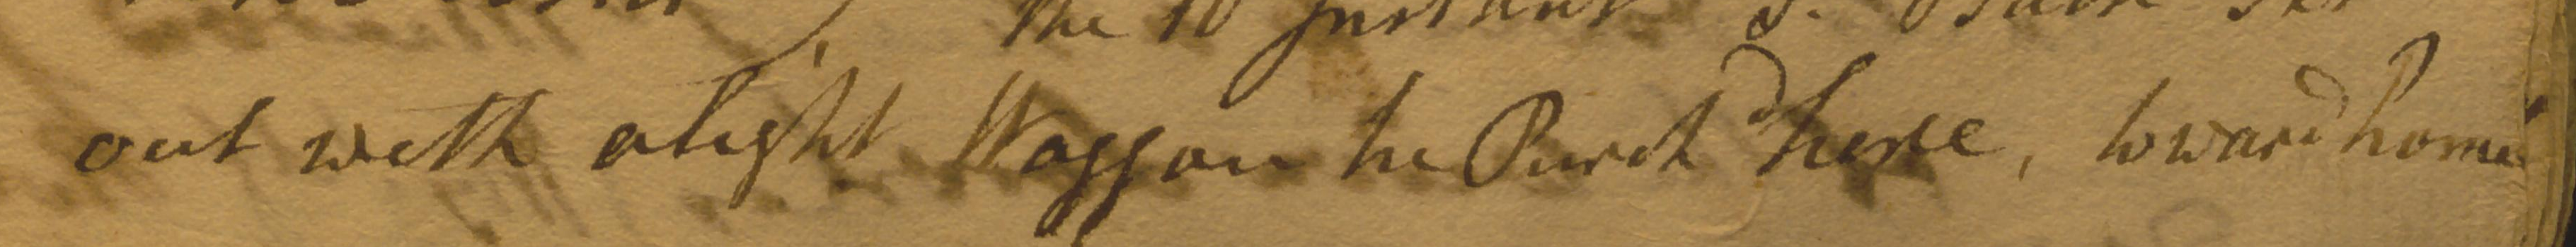out with a light Waggon he Purch^d here, toward home
